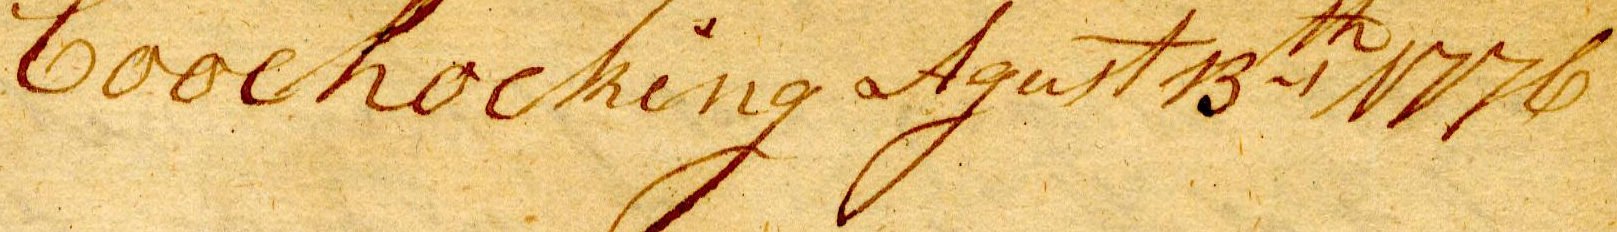Coochocking Agust 13^th. 1776
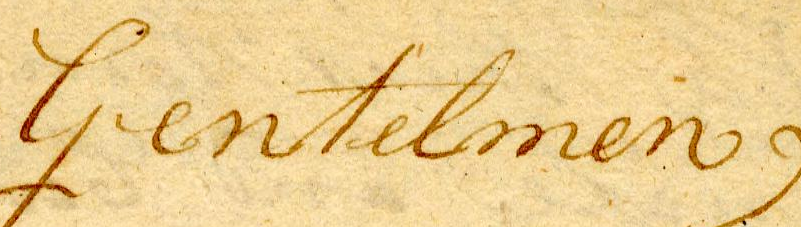Gentelmen,
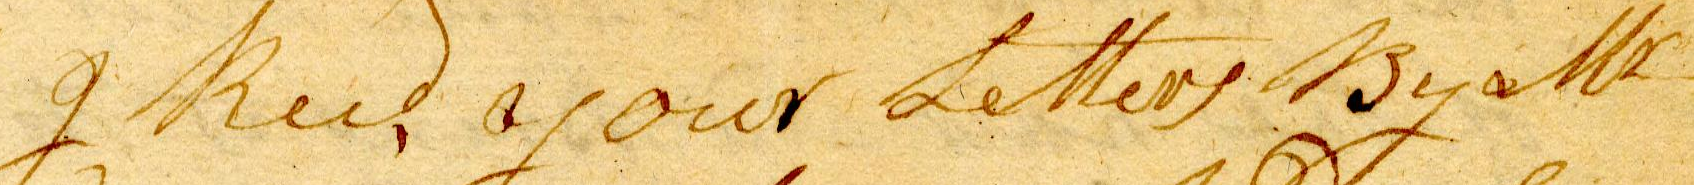I Read your Letters By M^r
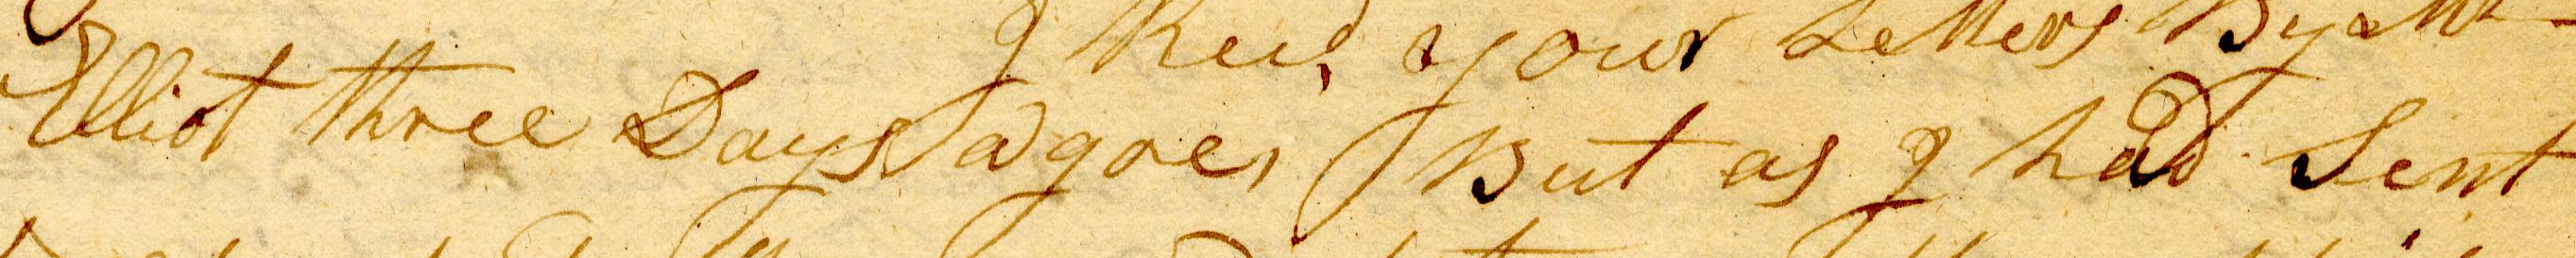Elliot three Days agoe, But as I had Sent
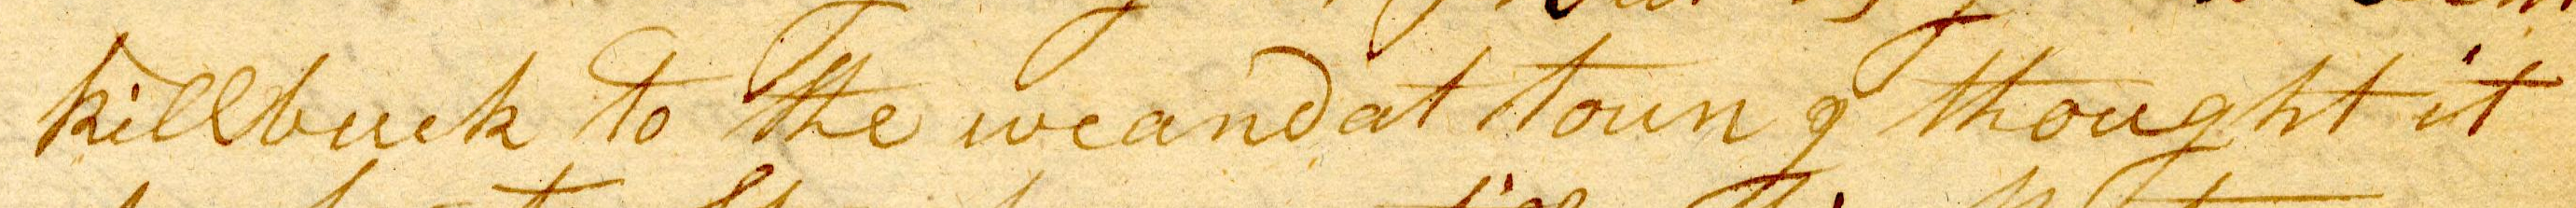Killbuck to the weandat toun I thought it
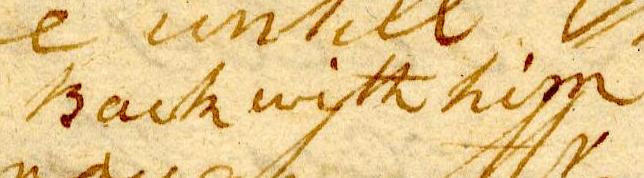Back with him
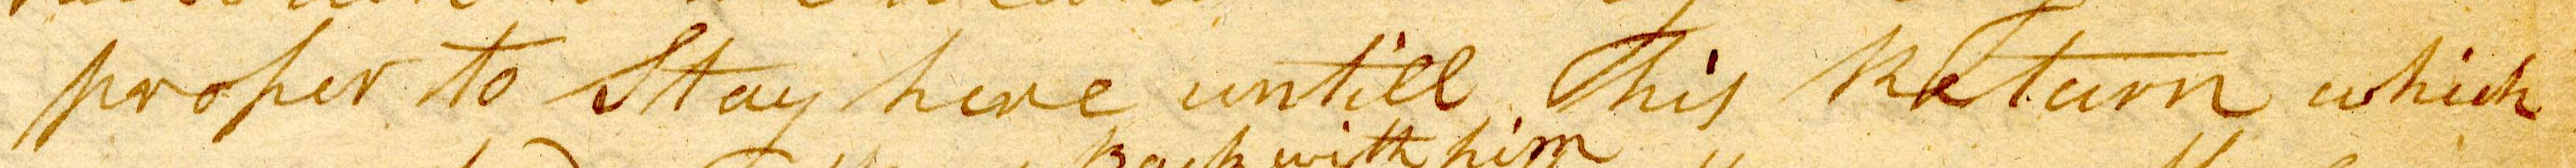proper to Stay here untill his Return which
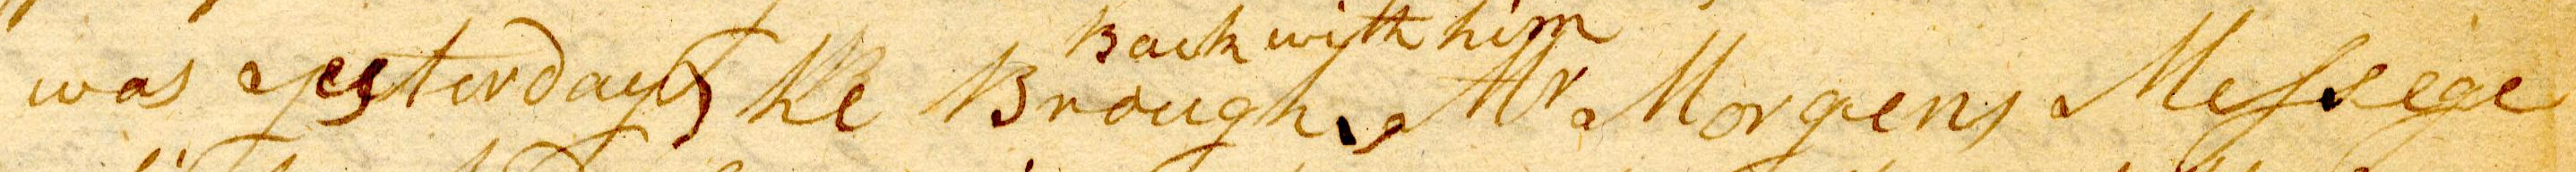was yesterday, he Brough ^ M^r. Morgens Message
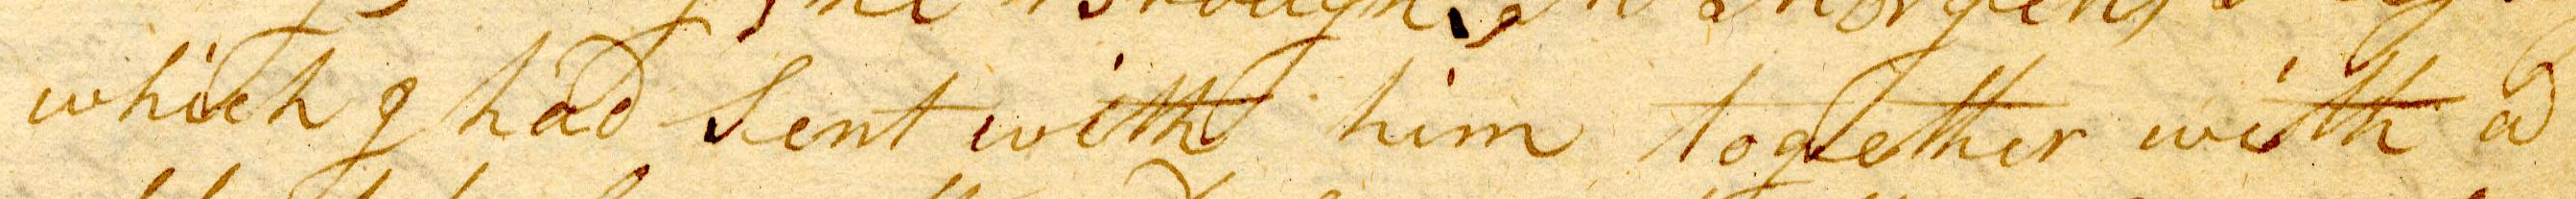which I had Sent with him together with a
